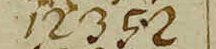12352
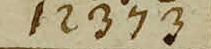12373
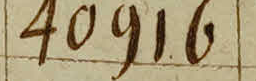40916
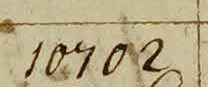10702
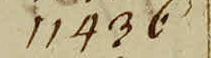11436
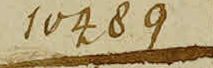10489
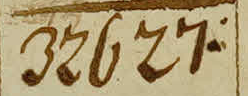32627
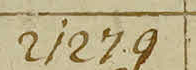21279
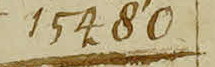15480
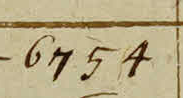6754
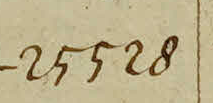25528
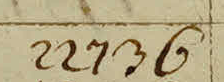22736
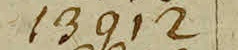13912
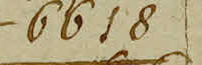6618
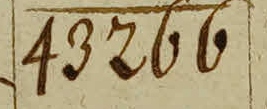43266
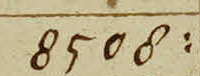8508
